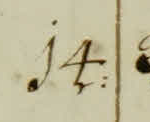14:
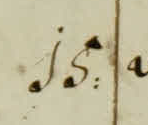15:
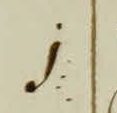1:
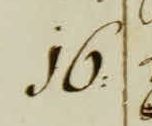16:
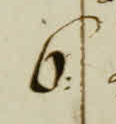6:
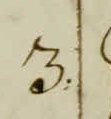3:
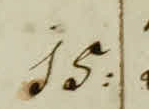15:
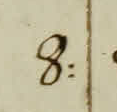8:
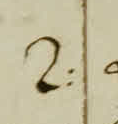2:
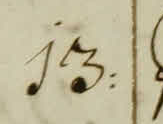13:
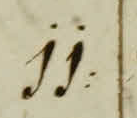11:
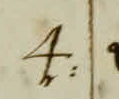4:
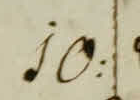10:
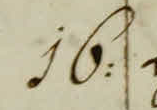16:
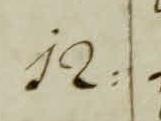12:
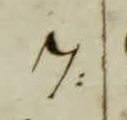7:
